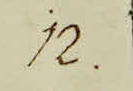12.
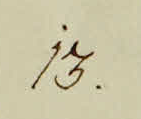13.
